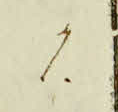1.
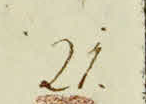21.
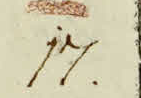17.
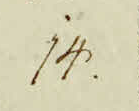14.
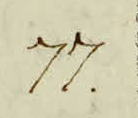77.
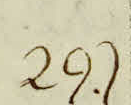29.
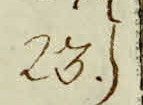23.
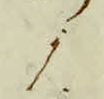1.
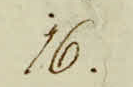16.
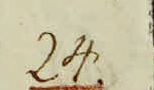24.
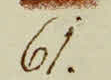61.
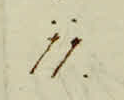11.
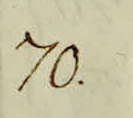70.
